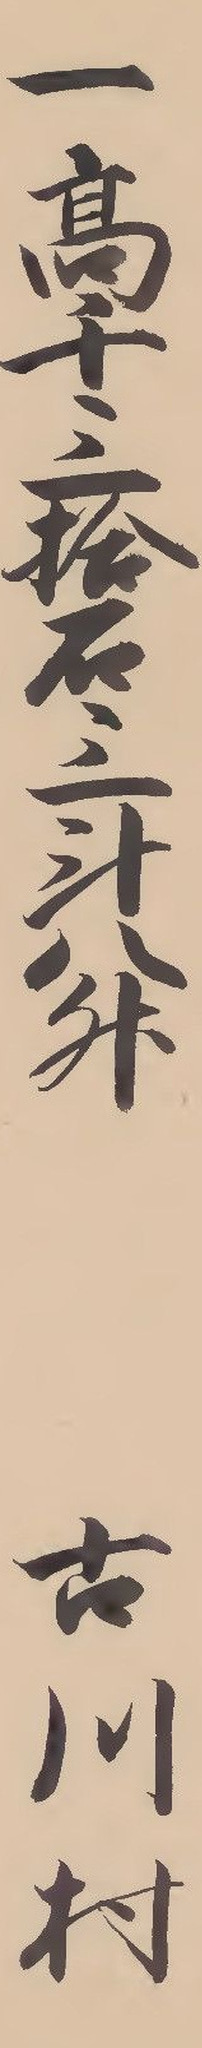一高千三拾石三斗八升古川村
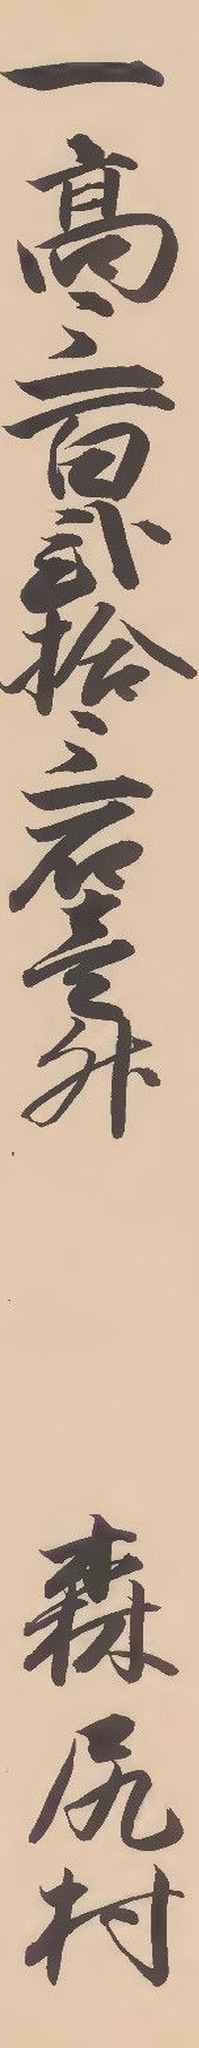一高三百弐拾三石壱升森尻村
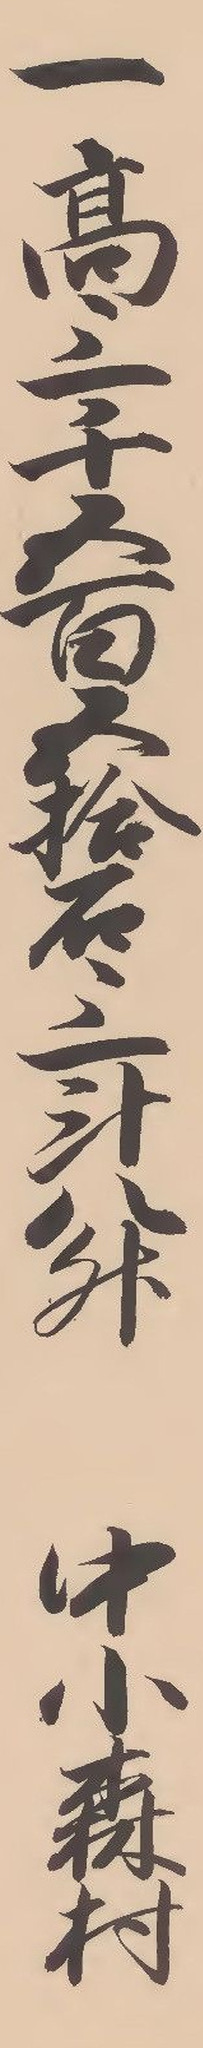一高三千五百五拾石三斗八升中小森村
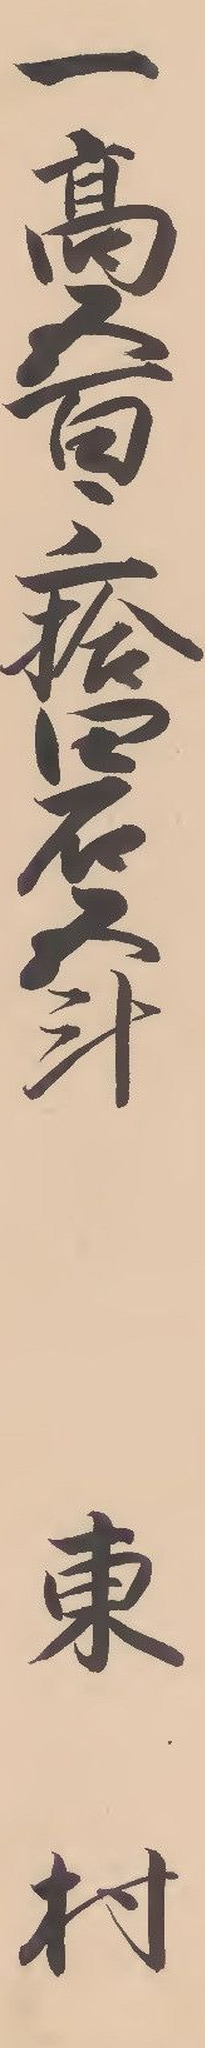一高五百三拾四石五斗東村

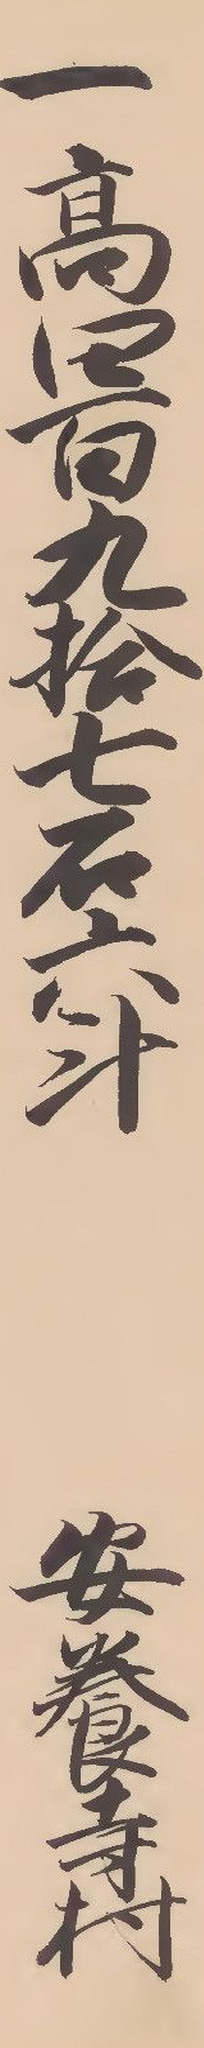一高四百九拾七石六斗安養寺村
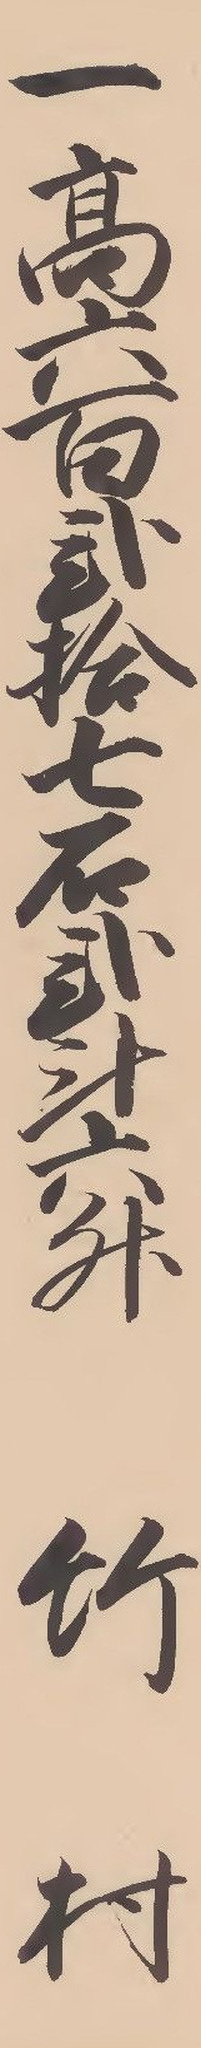一高六百弐拾七石弐斗六升竹村
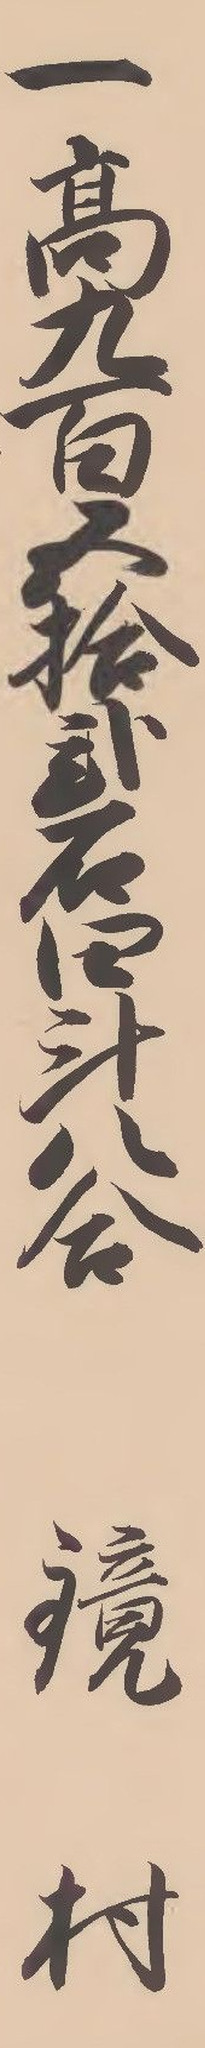一高九百五拾弐石四斗八合鏡村
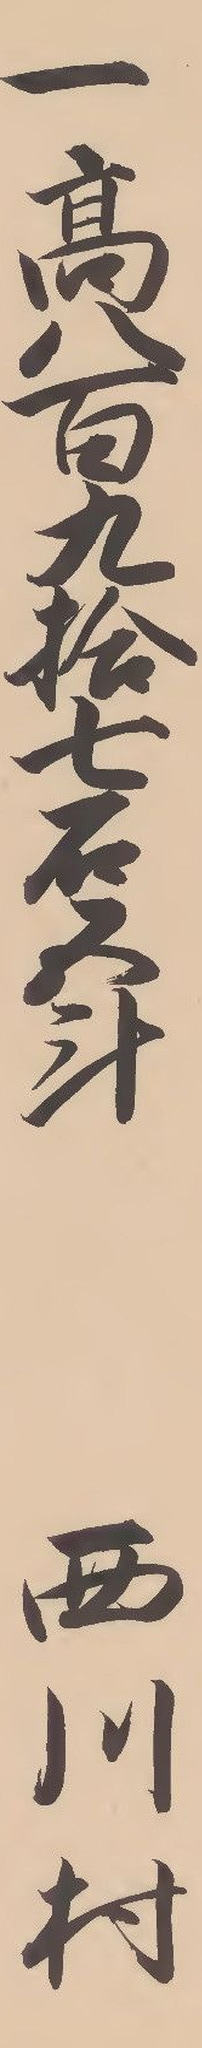一高八百九拾七石五斗西川村
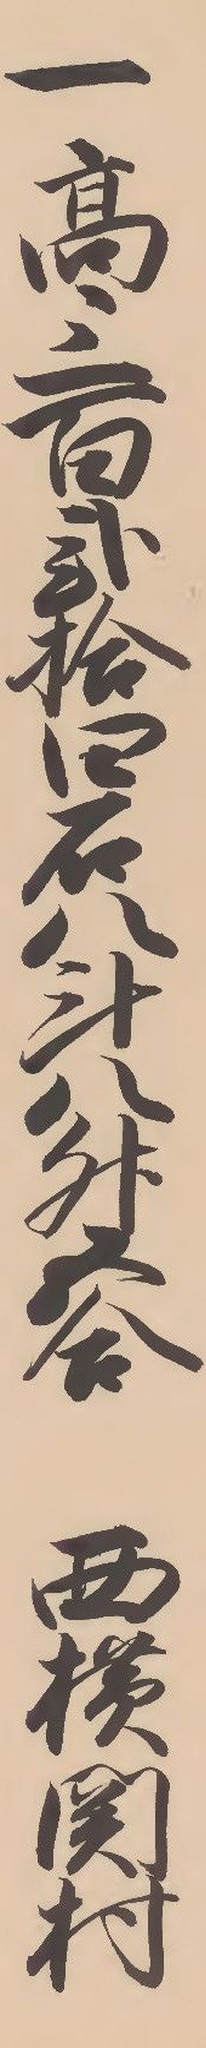一高三百弐拾四石八斗八升五合西横関村
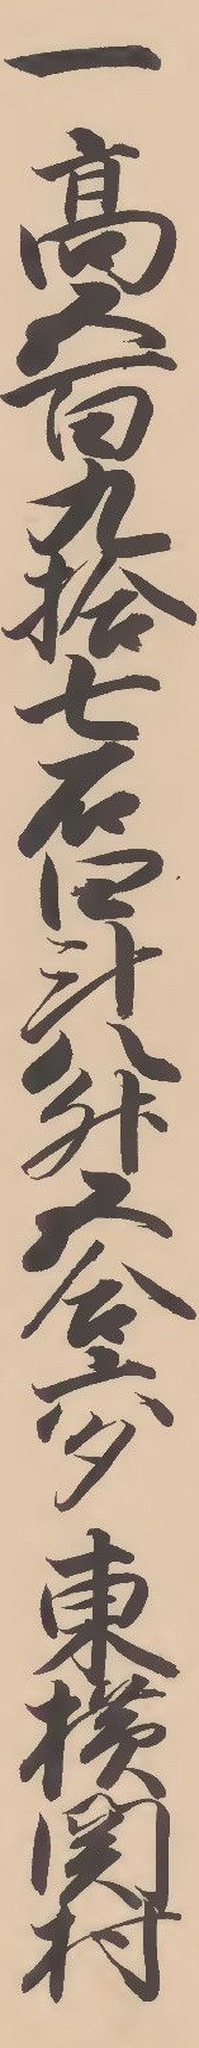一高五百九拾七石四斗八升五合六勺東横関村

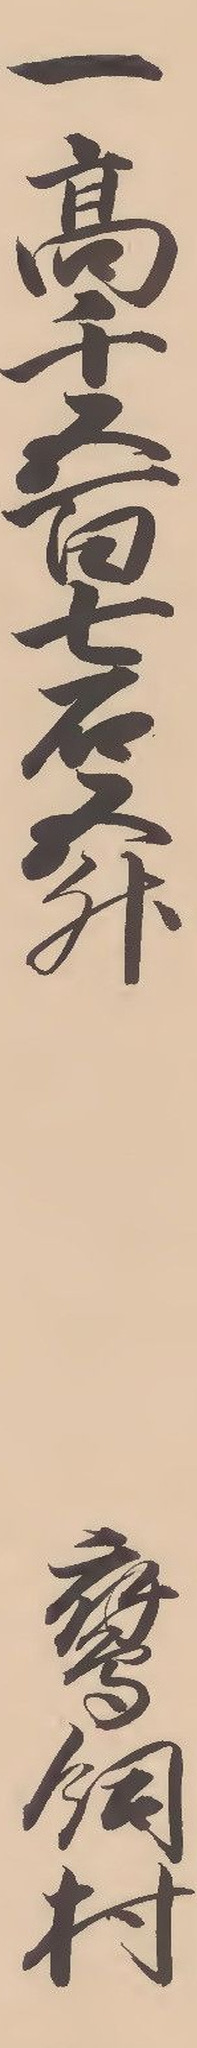一高千五百七石五升鷹飼村
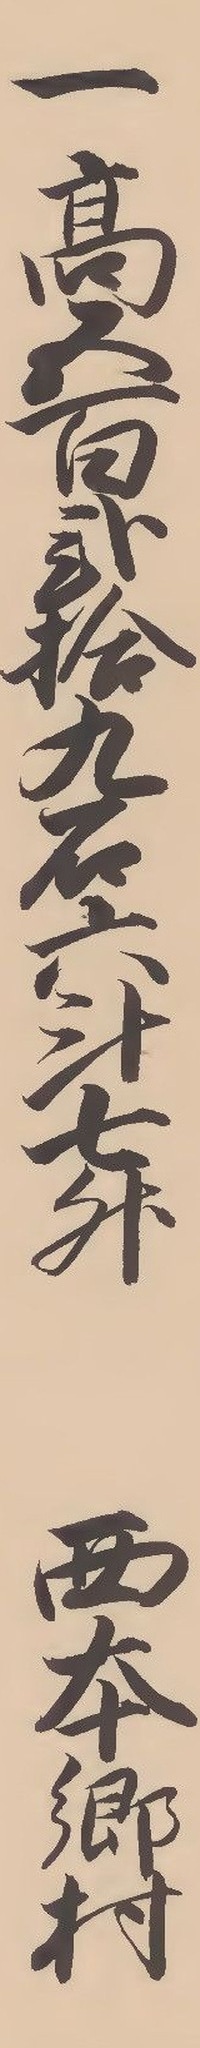一高五百弐拾九石六斗七升西本郷村
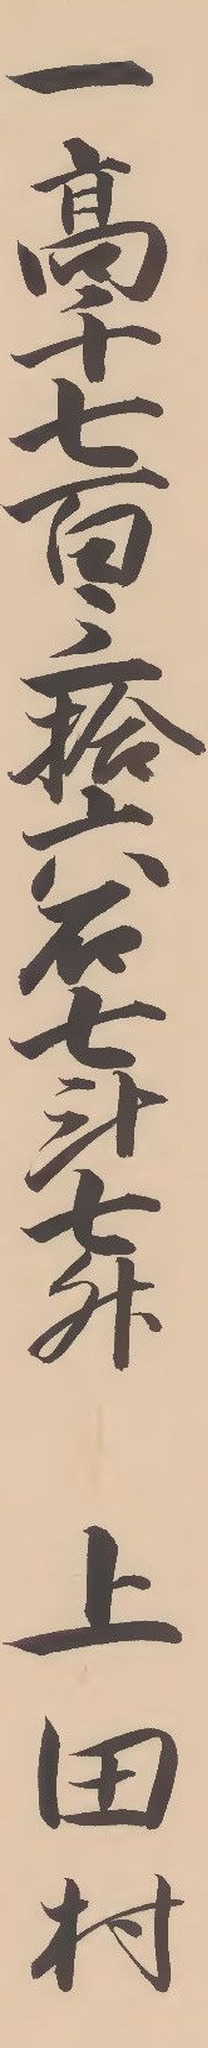一高千七百三拾六石七斗七升上田村
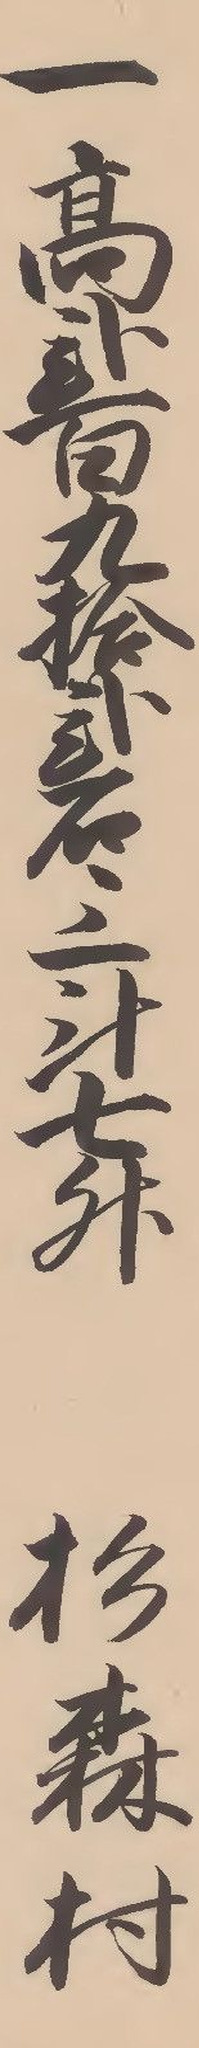一高弐百九拾弐石三斗七升杉森村
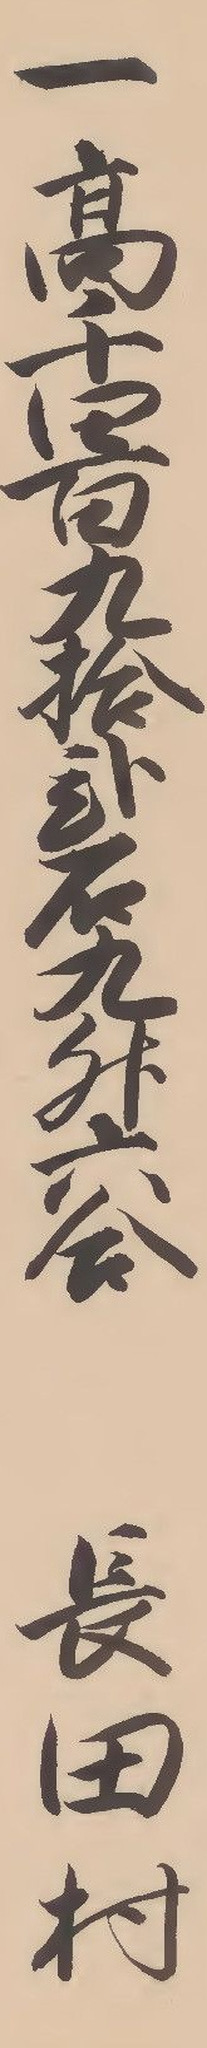一高千四百九拾弐石九升六合長田村
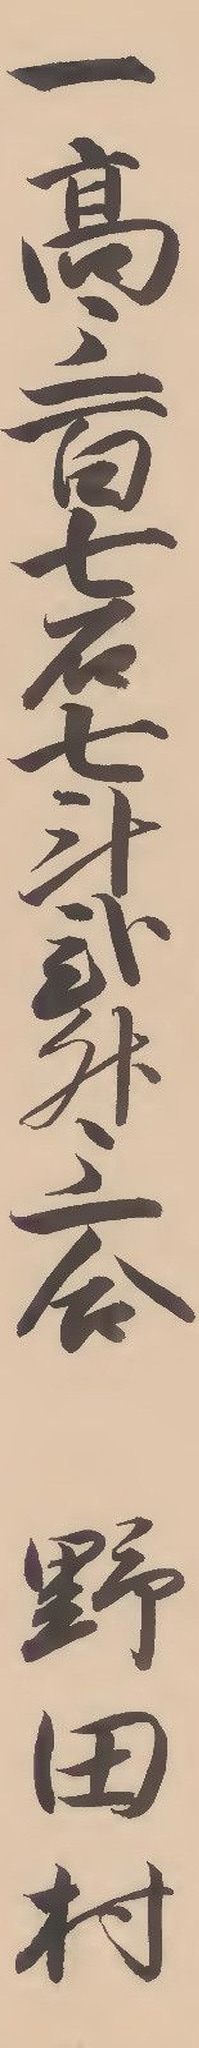一高三百七石七斗弐升三合野田村
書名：近江国郷帳
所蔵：国立公文書館 National Archives of Japan
